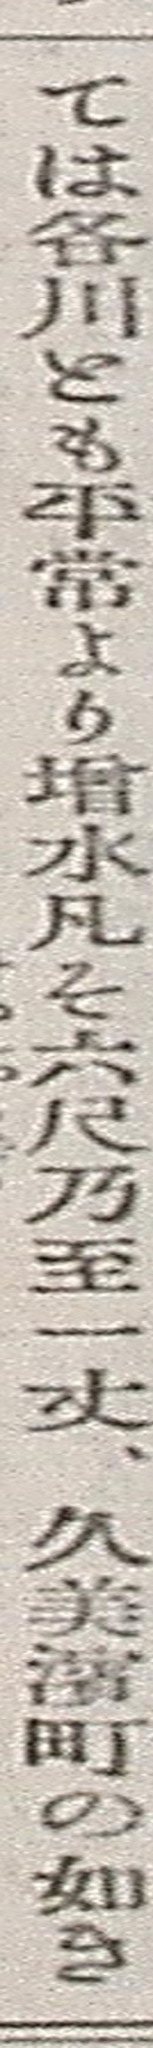ては各川とも平常より増水凡そ六尺乃至一丈、久美浜町の如き
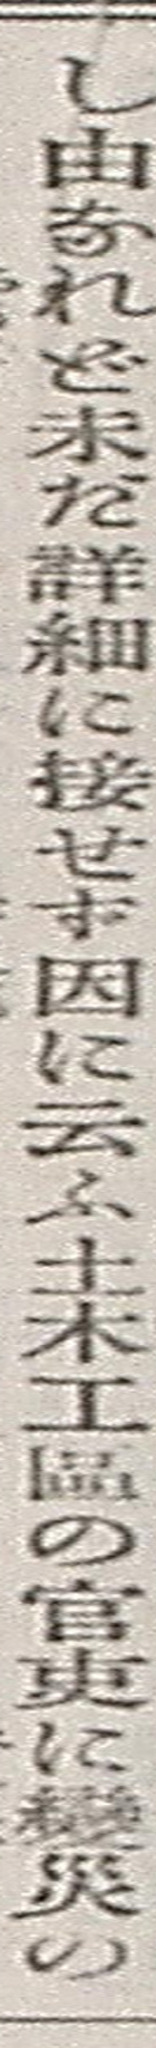し由なれど未だ詳細に接せず因に云ふ土木工區の官吏に変災の
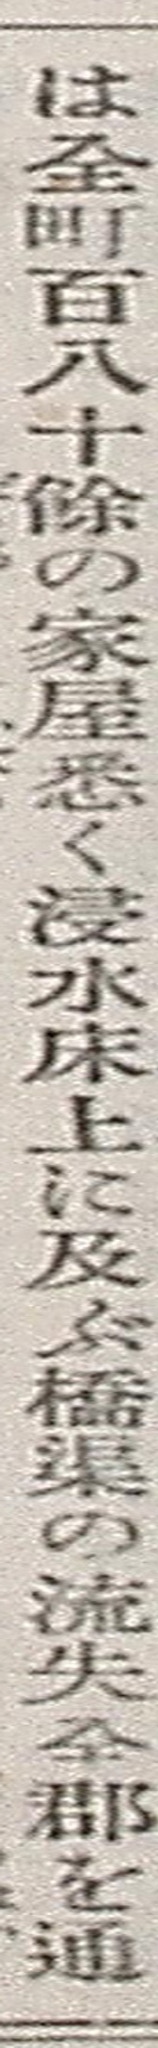は全町百八十餘の家屋悉く浸水床上に及ぶ橋梁の流失全郡を通
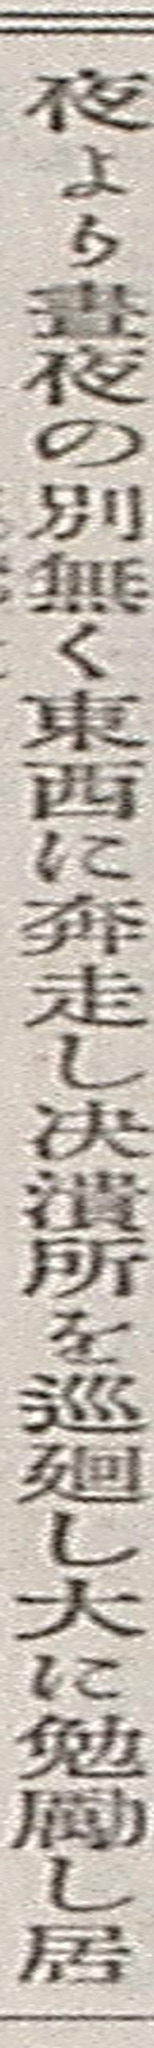夜より晝夜の別無く東西に奔走し决潰所を巡廻し大に勉励し居
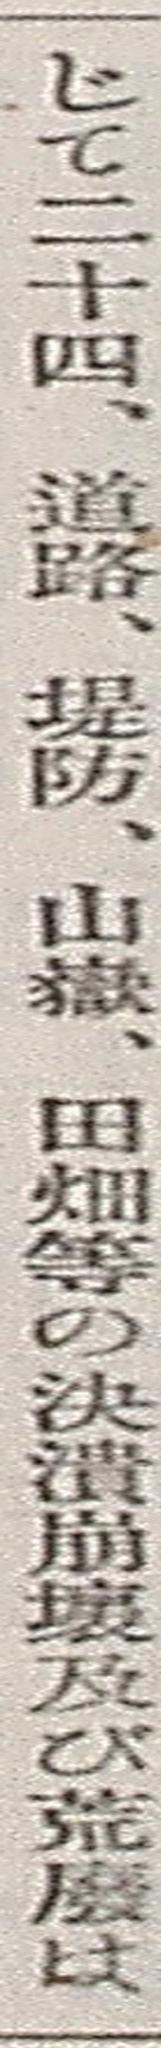じて二十四、道路、堤防、山嶽、田畑の决潰崩壊及び荒廃は
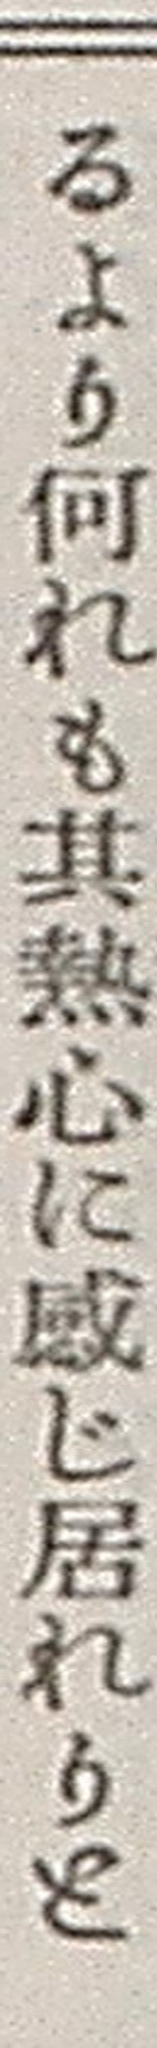るより何れも其熱心に感じ居れりと
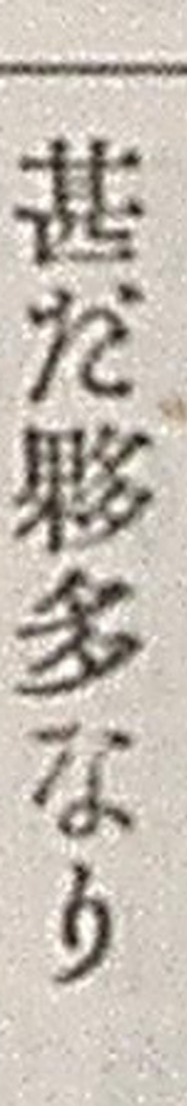甚だ夥多なり
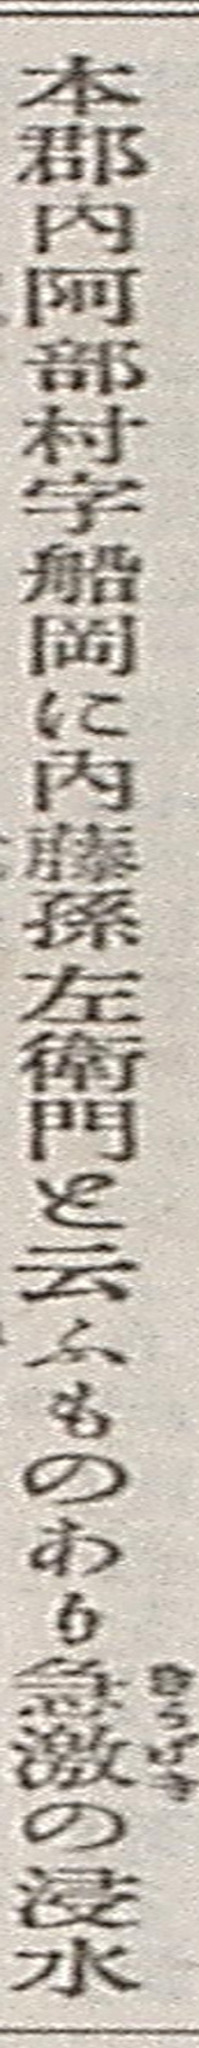本郡内阿部村字船岡に内藤孫左衛門と云ふものあり急激の浸水
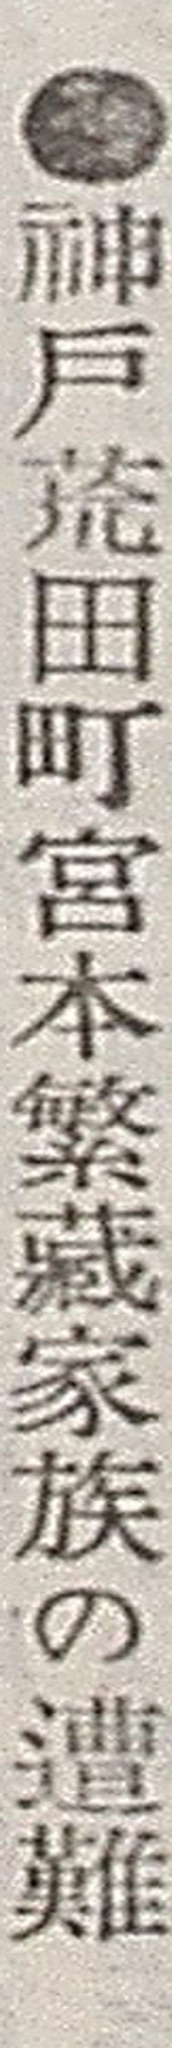●神戸荒田町宮本繁蔵家族の遭難
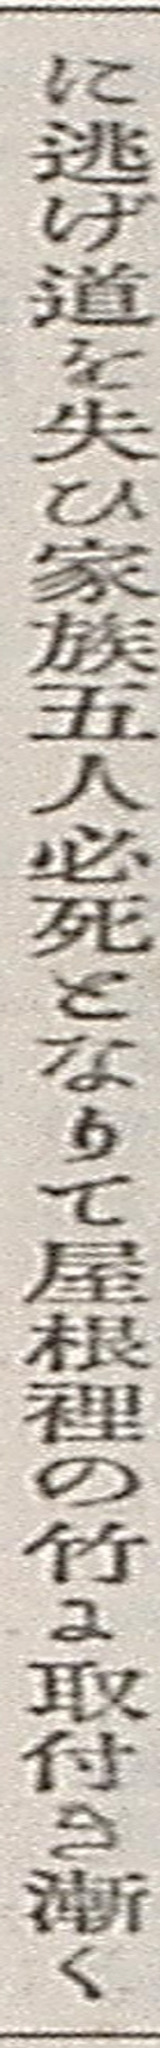に逃げ道を失ひ家族五人必死となりて屋根裡の竹に取付き漸く
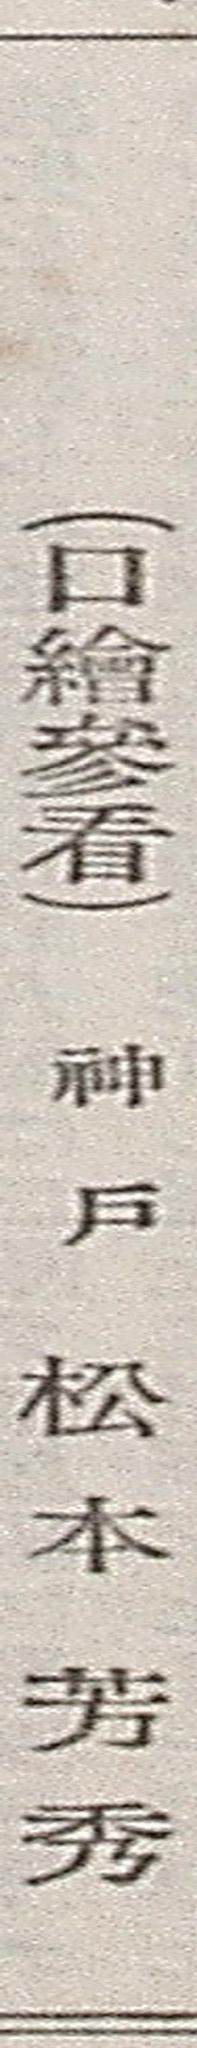神戸松本芳秀
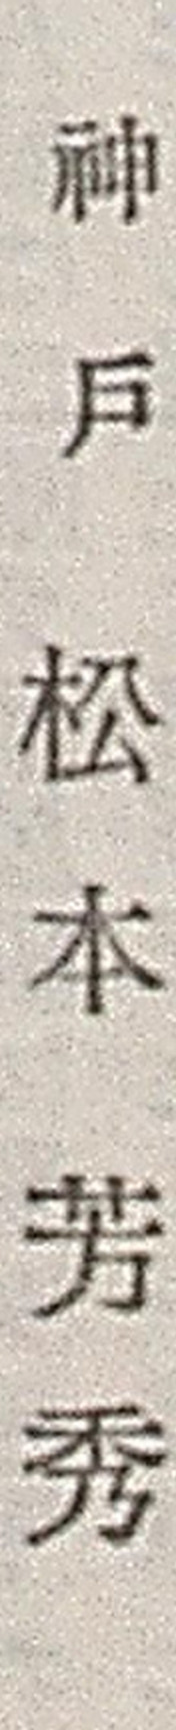神戸松本芳秀
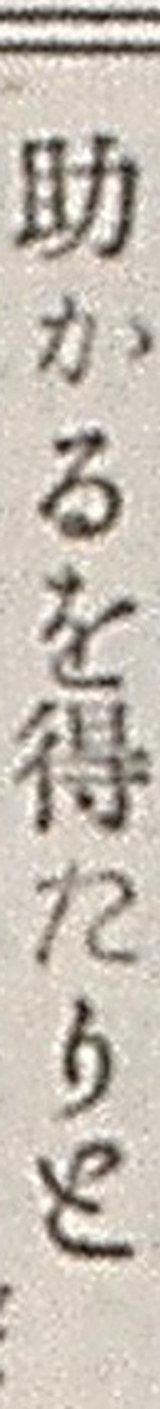助かるを得たりと
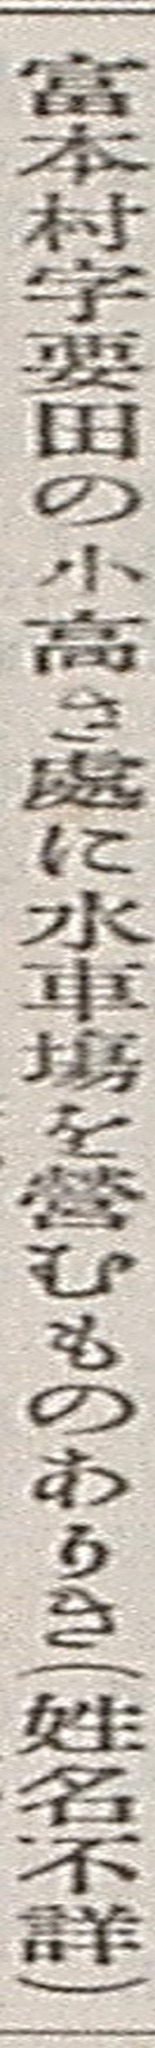富本村字要田の小高き処に水車場を営むものありき
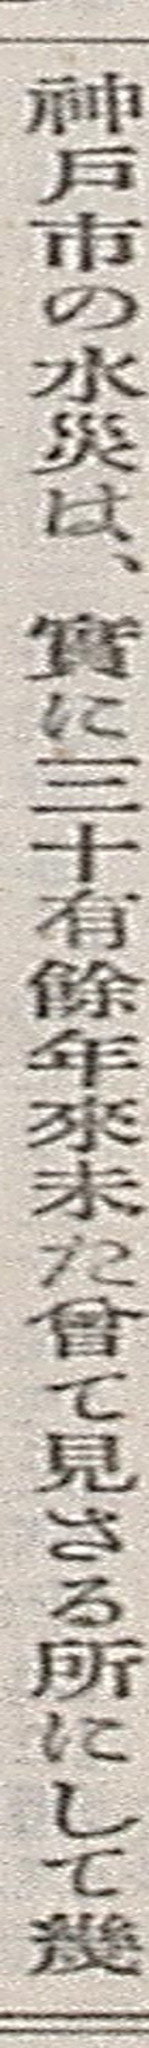神戸市の水災は、実に三十有餘年來未だ曾て見さる所にして幾
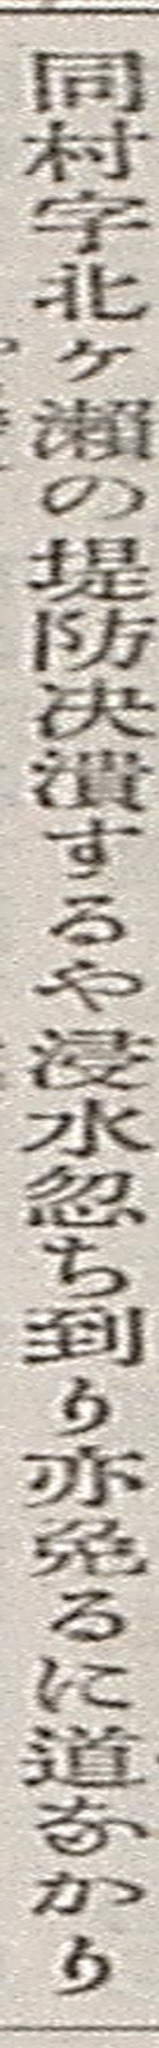同村字北ヶ瀬の堤防决潰するや浸水忽ち到り亦免るに道なかり
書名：風俗畫報臨時増刊第百二十六號　洪水被害録（中）
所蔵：東京大学地震研究所図書室 Earthquake Research Institute Library, The University of Tokyo, JAPAN
